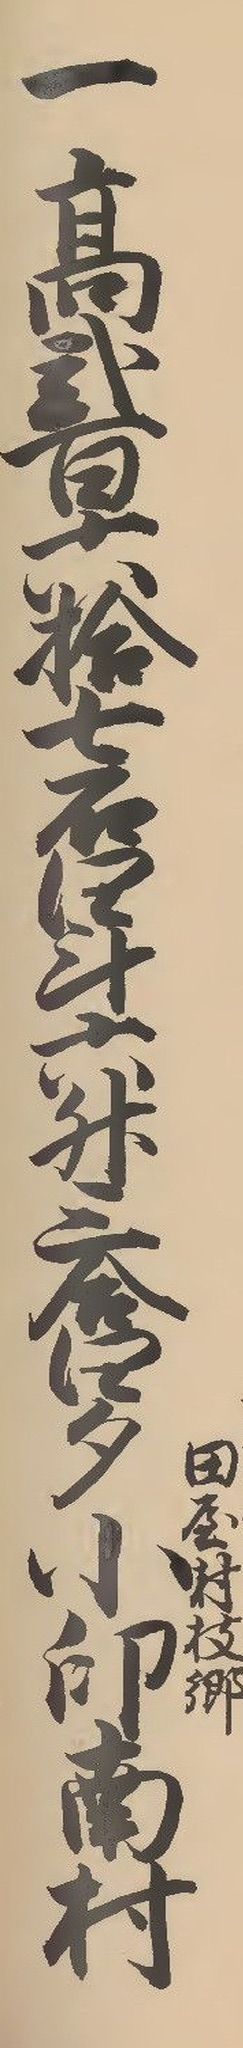一髙弐百六拾七石四斗六升三合四夕小印南村
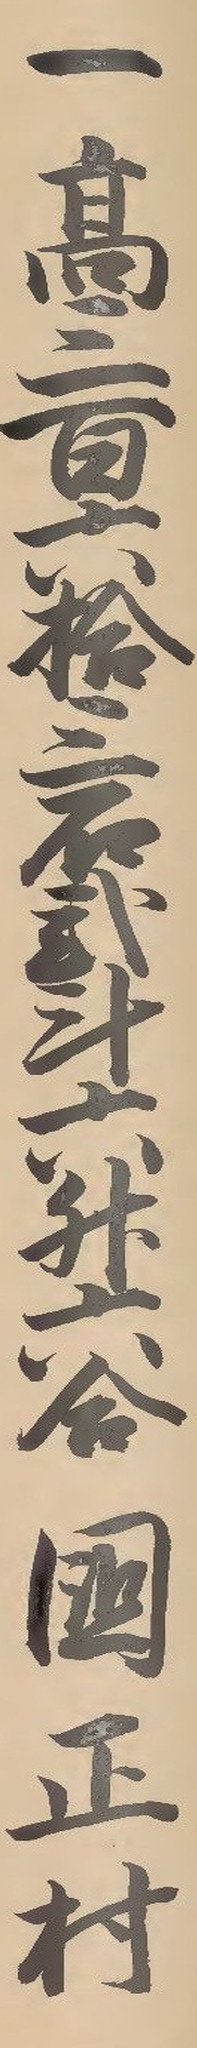一髙三百六拾三石弐斗六升六合國正村
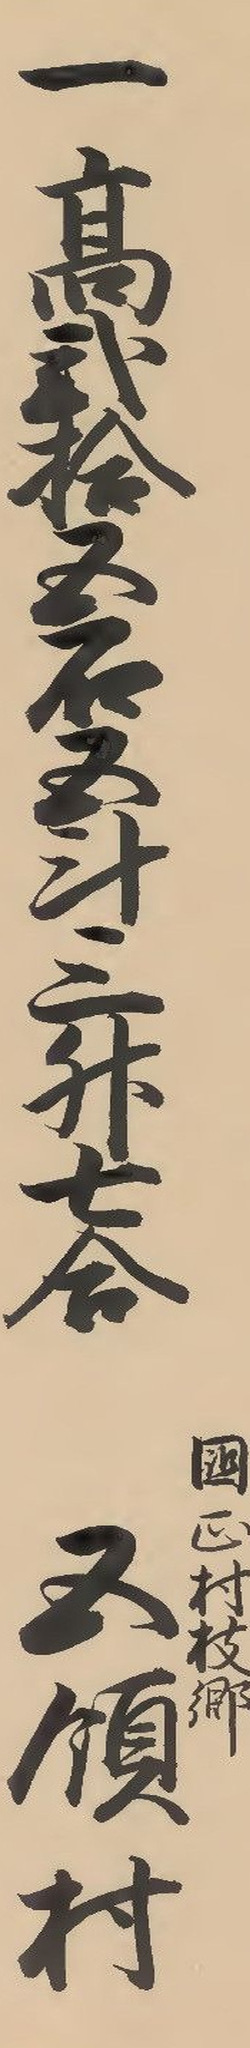一髙弐拾五石五斗三升七合五領村
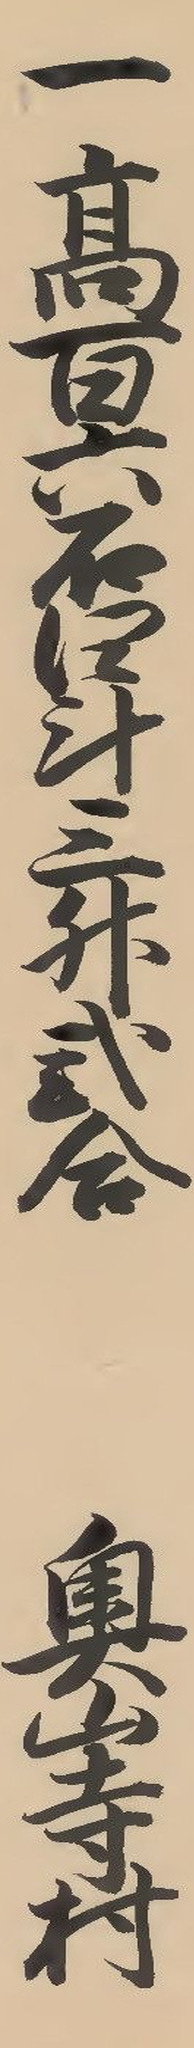一髙百六石四斗三升弐合奥山寺村
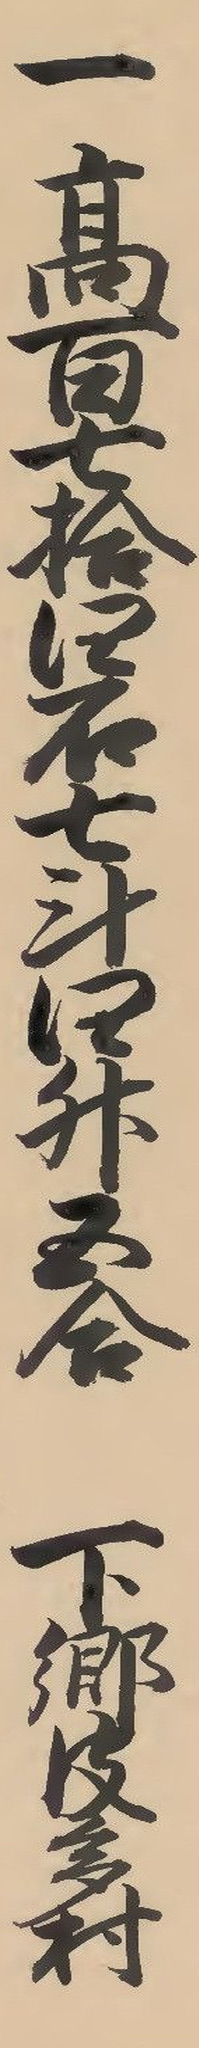一髙百七拾四石七斗四升五合下郷皮多村

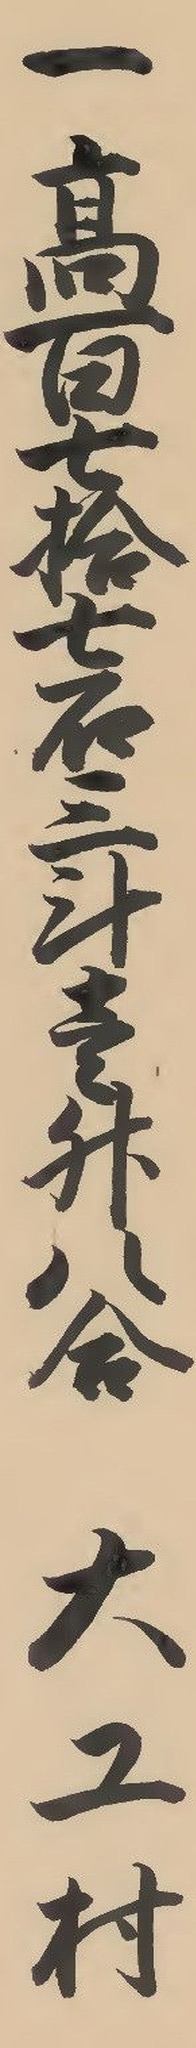一髙百七拾七石三斗壱升八合大工村
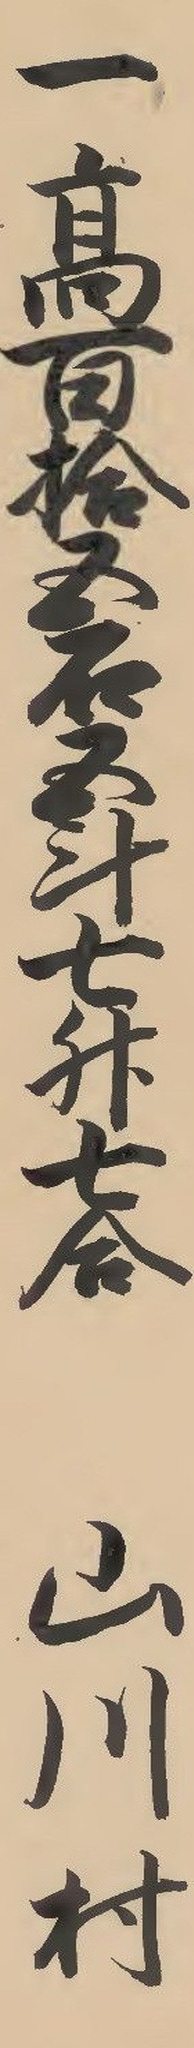一髙百拾五石五斗七升七合山川村
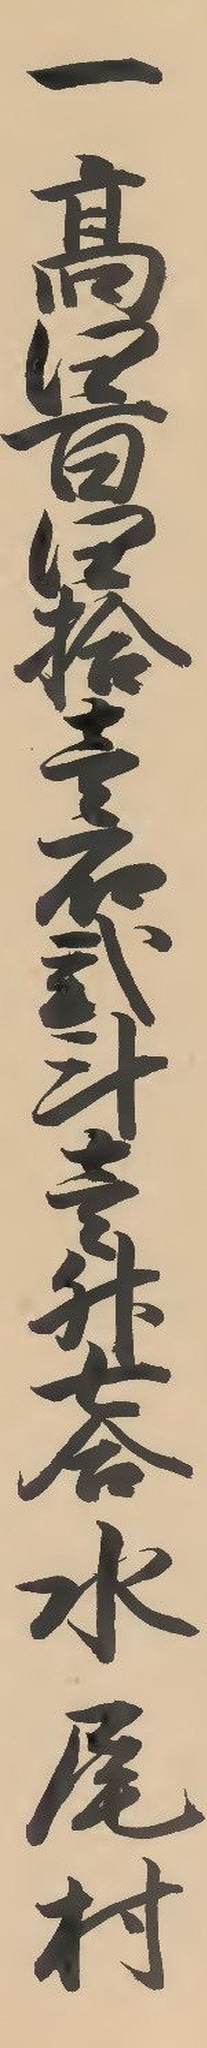一髙四百四拾壱石弐斗壱升七合水尾村
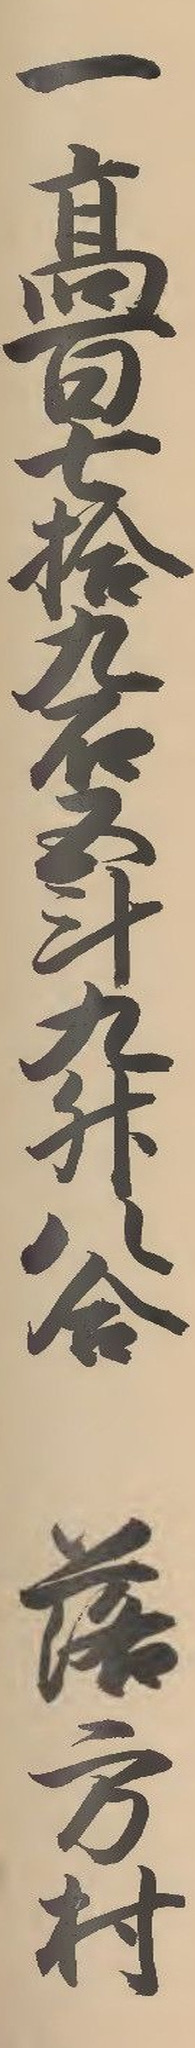一髙百七拾九石五斗九升八合落方村
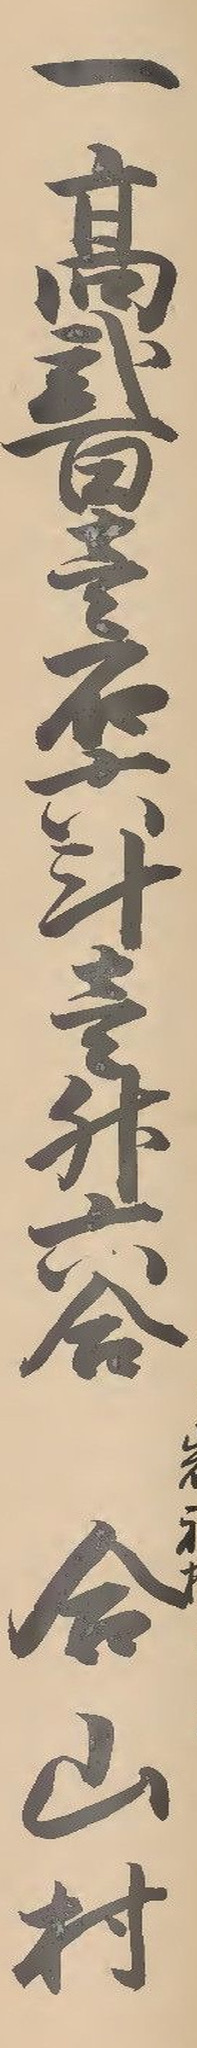一髙弐百壱石六斗壱升六合合山村
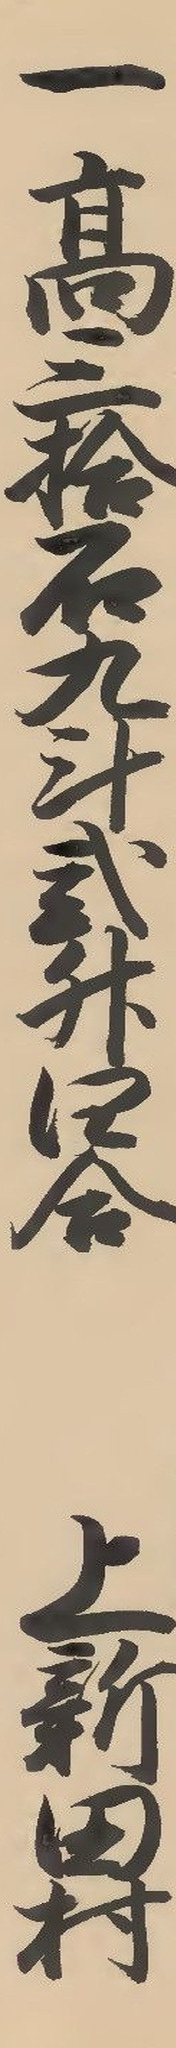一髙三拾石九斗弐升四合上新田村
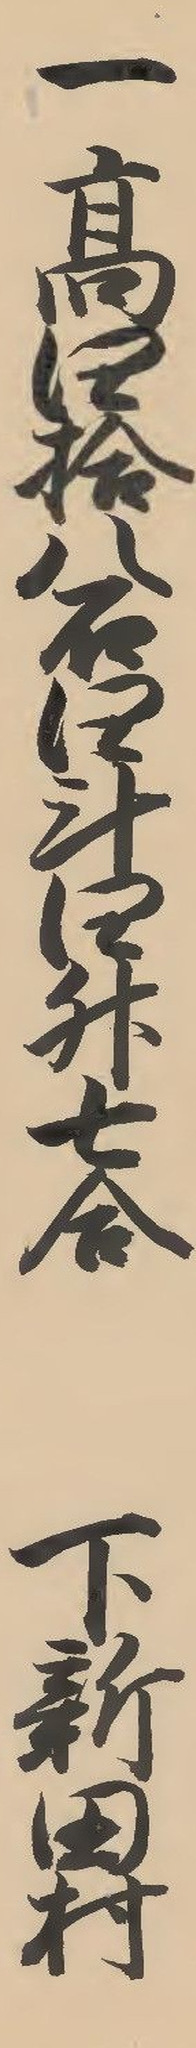一髙四拾八石四斗四升七合下新田村
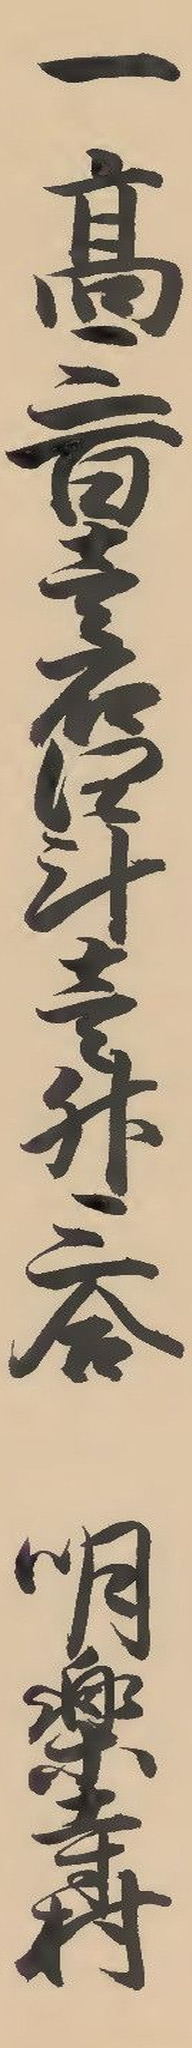一髙三百壱石四斗壱升三合明樂寺村

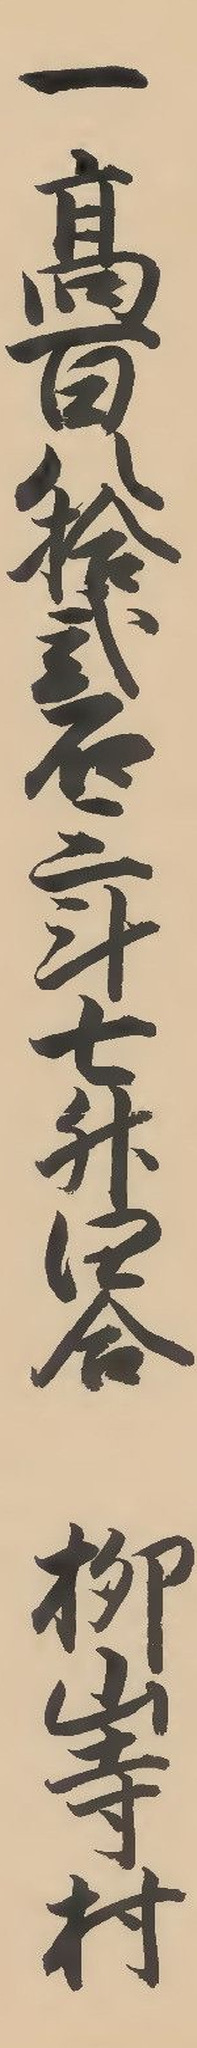一髙百八拾弐石三斗七升四合柳山寺村
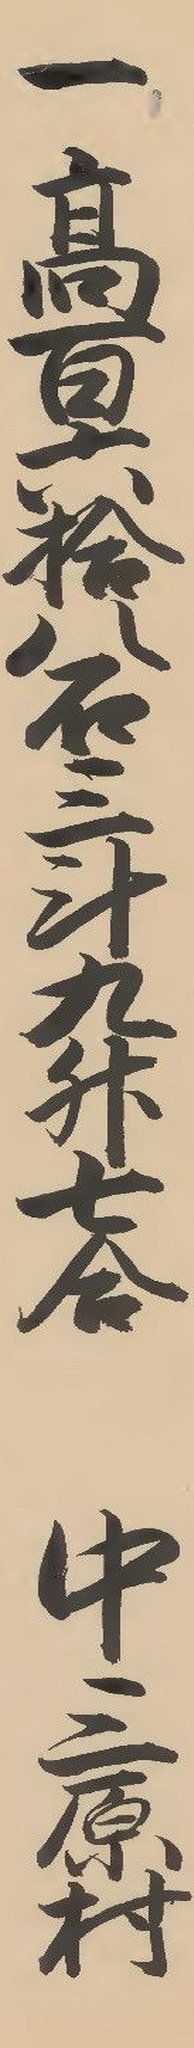一髙百六拾八石三斗九升七合中三原村
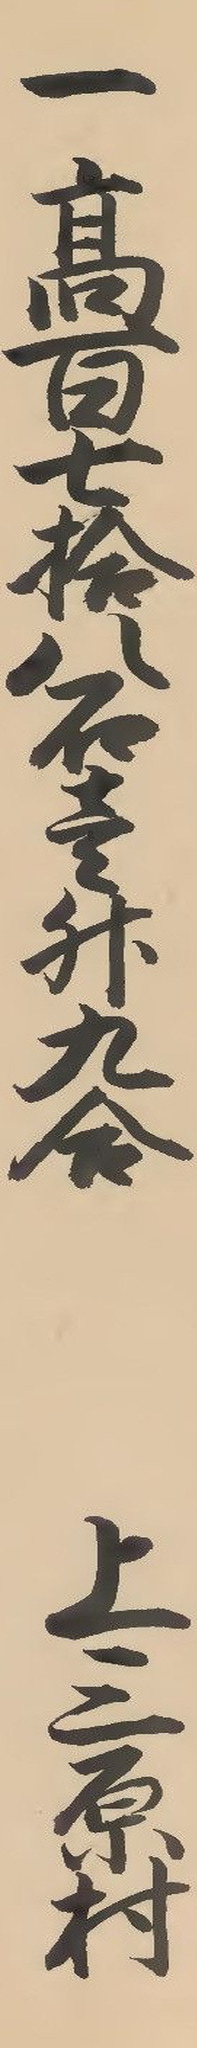一髙百七拾八石壱升九合上三原村
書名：播磨国郷帳
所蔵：国立公文書館 National Archives of Japan
